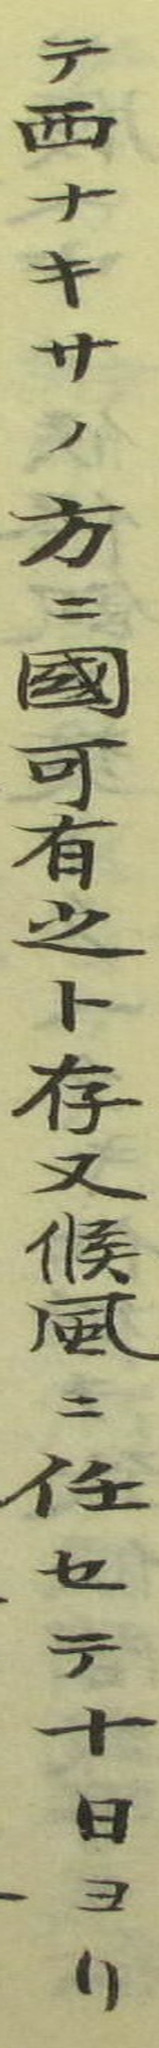テ西ナキサノ方ニ國可有之ト存又候風ニ任セテ十日ヨリ
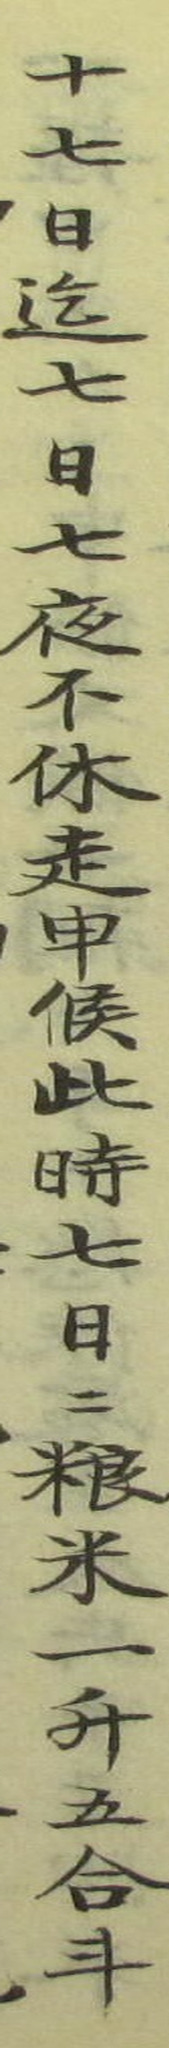十七日迄七日七夜不休走申候此時七日ニ粮米一升五合斗
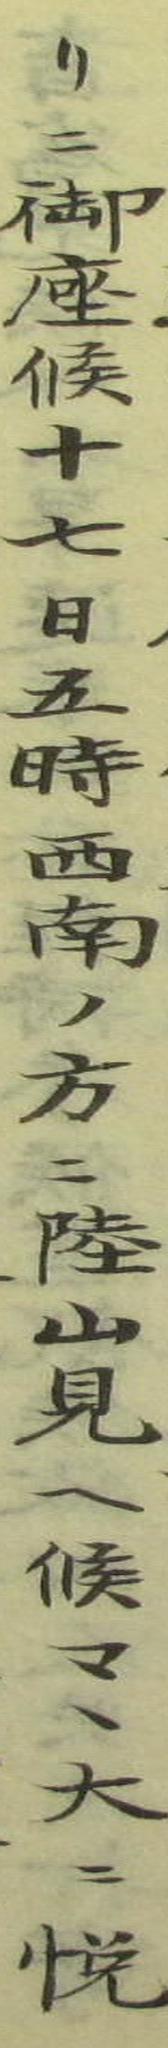リニ御座候十七日五時西南ノ方ニ陸山見ヘ候マヽ大ニ悦
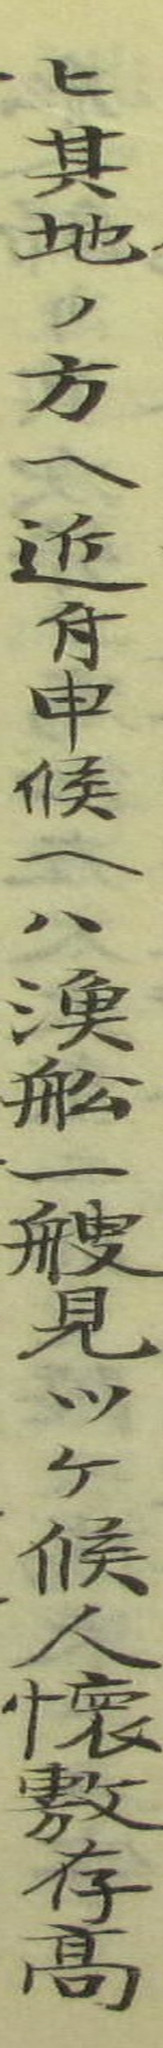ヒ其地ノ方ヘ近付申候ヘハ漁舩一艘見ツケ候人懐敷存高
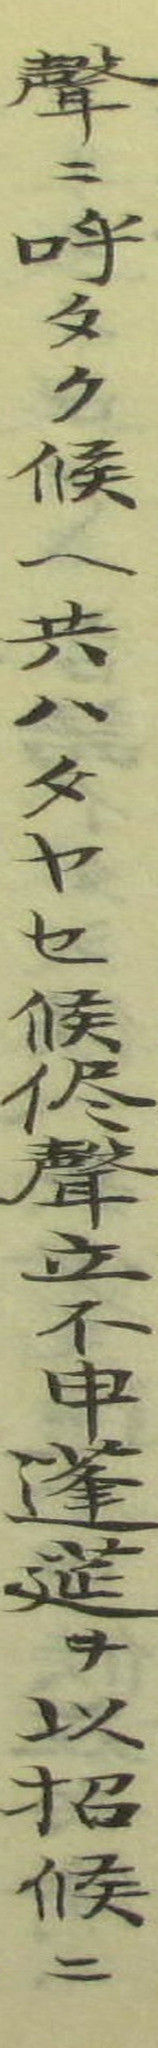聲ニ呼タク候ヘ共ハタヤセ候侭聲立不申蓬筵ヲ以招候ニ
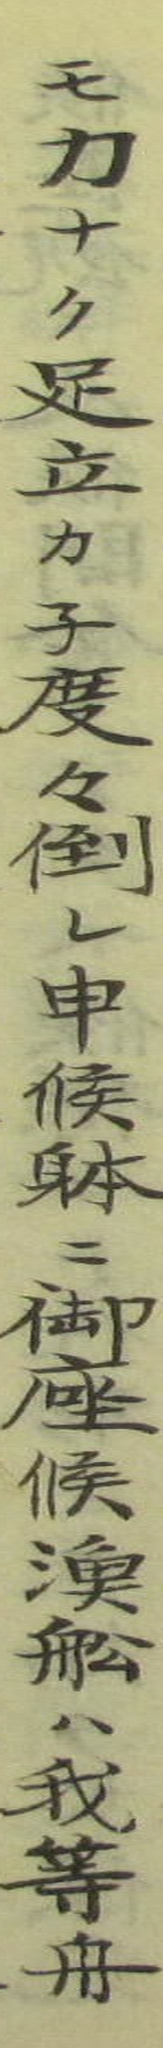モ力ナク足立カ子度々倒レ申候躰ニ御座候漁舩ハ我等舟
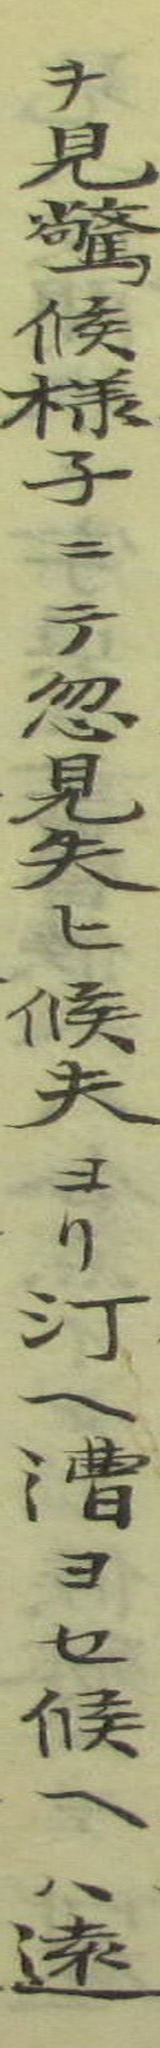ヲ見驚候様子ニテ忽見失ヒ候夫ヨリ汀ヘ漕ヨセ候ヘハ遠
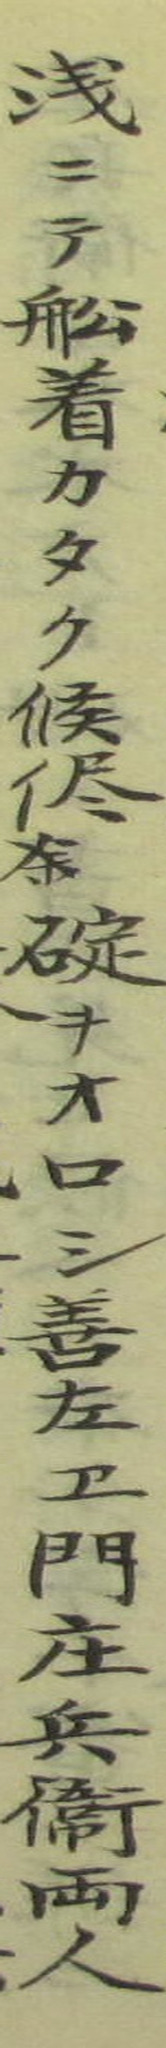浅ニテ舩着カタク候侭余碇ヲオロシ善左ヱ門庄兵衛両人
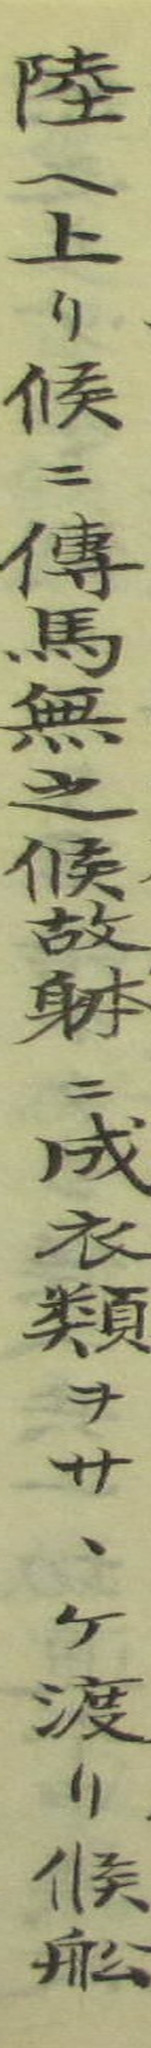陸ヘ上リ候ニ傳馬無之候故躰ニ成衣類ヲサヽケ渡リ候舩
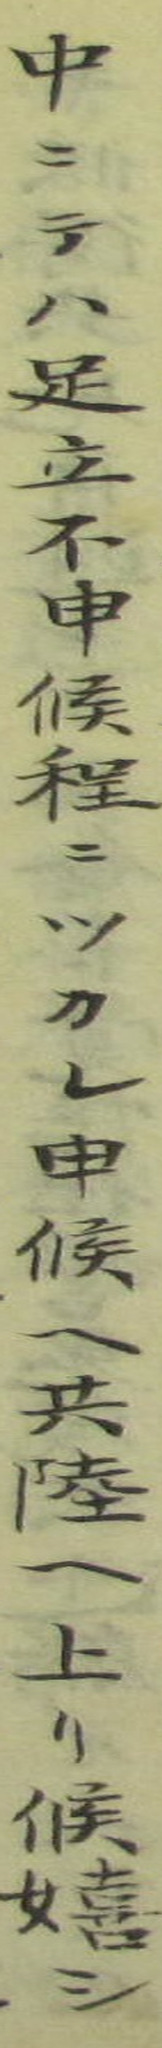中ニテハ足立不申候程ニツカレ申候ヘ共陸ヘ上リ候嬉シ
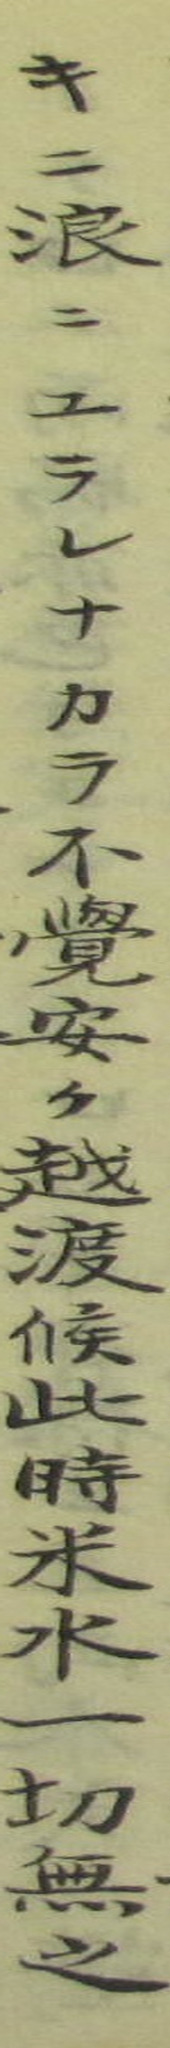キニ浪ニユラレナカラ不覚安ク越渡候此時米水一切無之
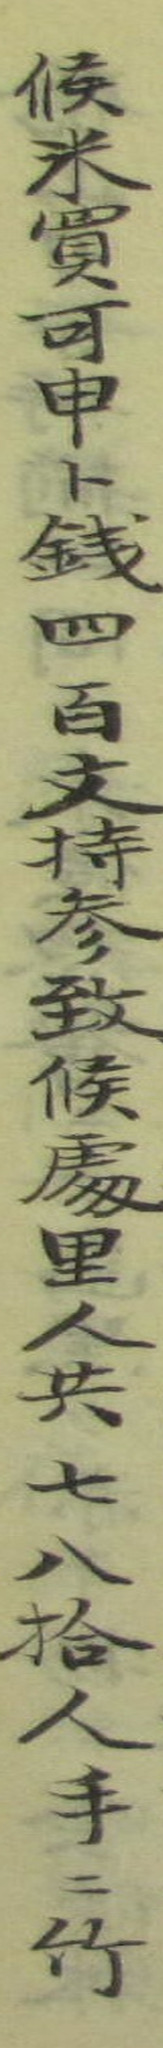候米買可申ト銭四百文持参致候處里人共七八拾人手ニ竹

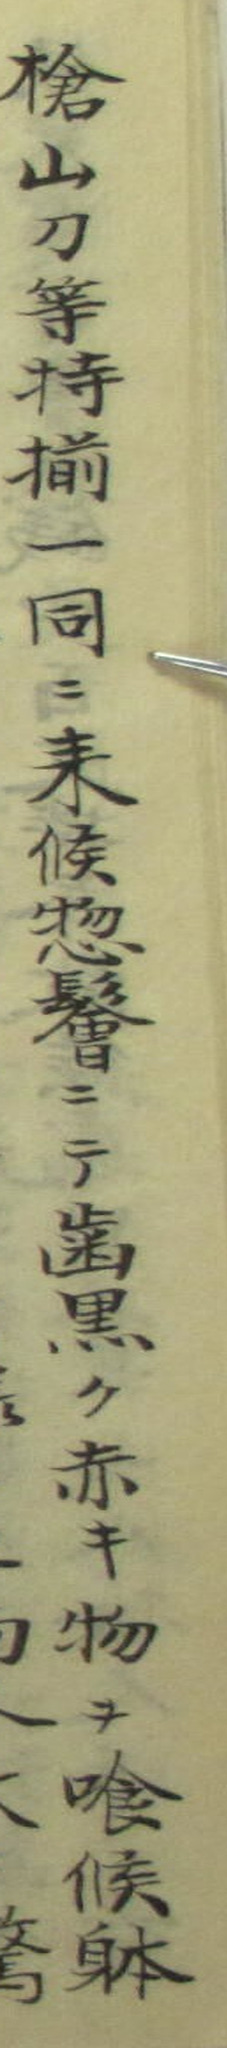槍山刀等持揃一同ニ来候惣鬠似て歯黒ク赤キ物ヲ喰候躰
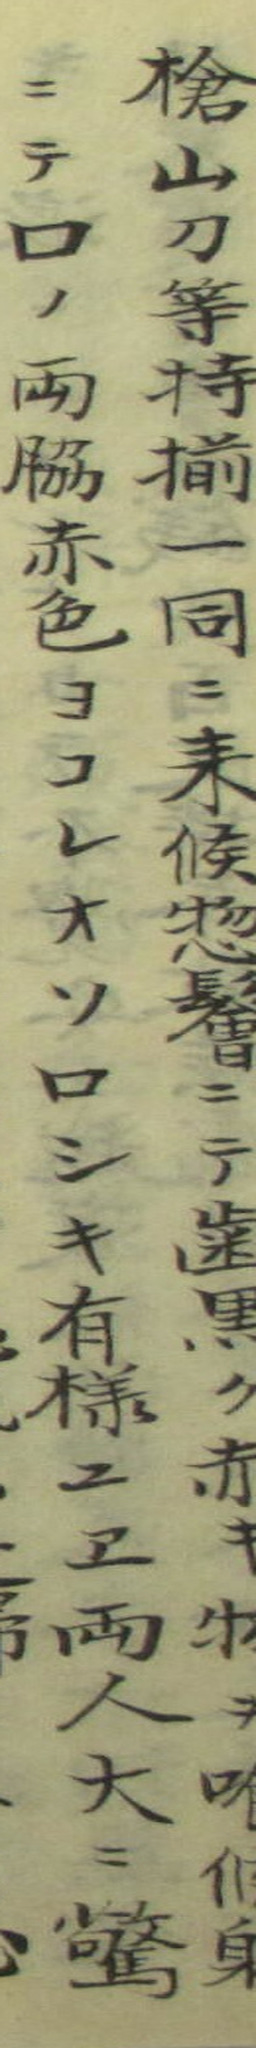ニテ口ノ両脇赤色ヨコレオソロシキ有様ユヱ両人大ニ驚
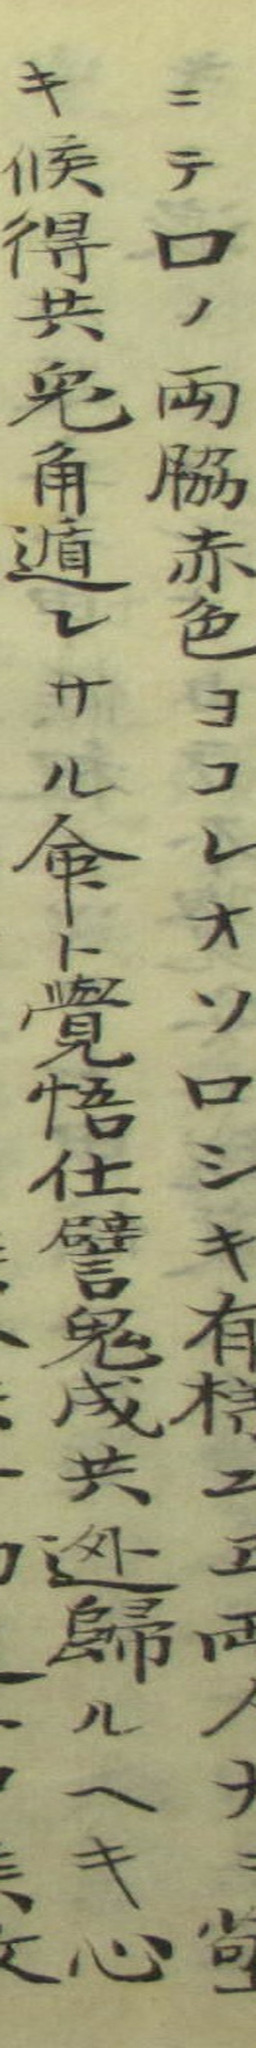キ候得共兎角遁レサル命ト覚悟仕譬鬼戌共逃帰ルヘキ心
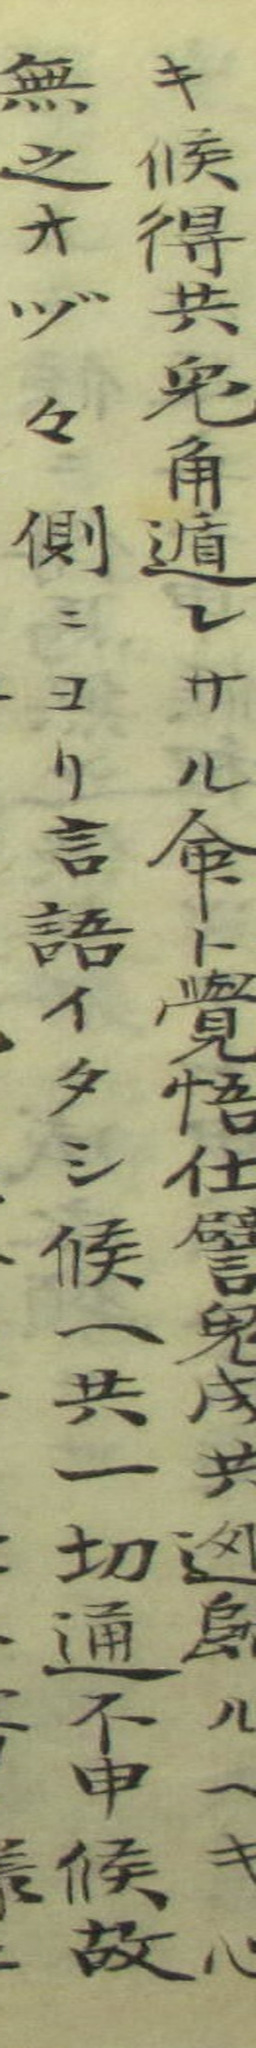無之オヅ々側ニヨリ言語イタシ候ヘ共一切通不申候故
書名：異国船漂着記 外二
